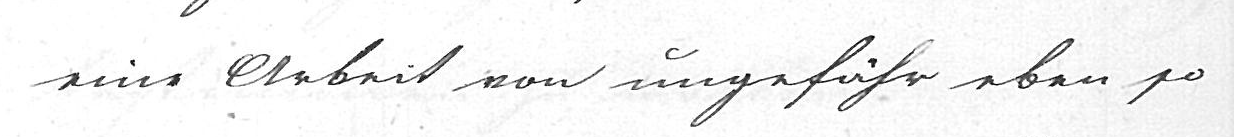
eine Arbeit von ungefähr eben so
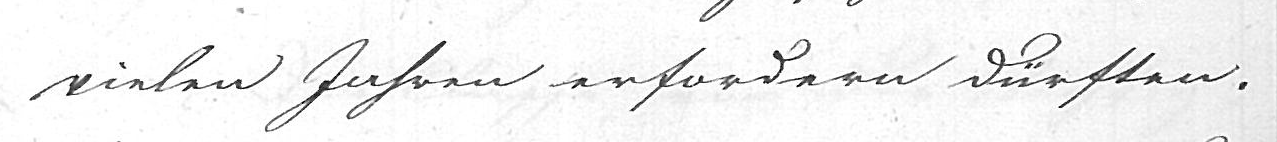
viele Jahren erfordern dürften.
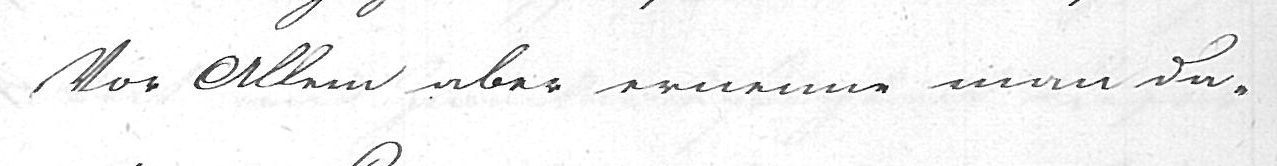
Von Allem aber ernenne man da-
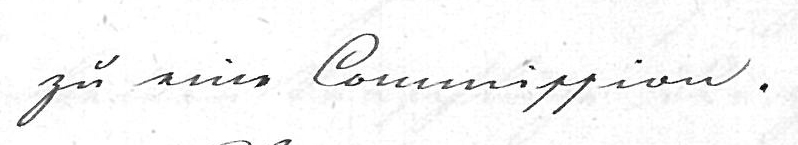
zu eine Commission.
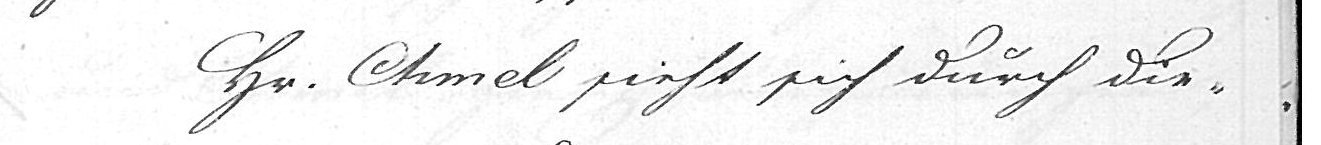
Hr. Chmel sich sich durch die-
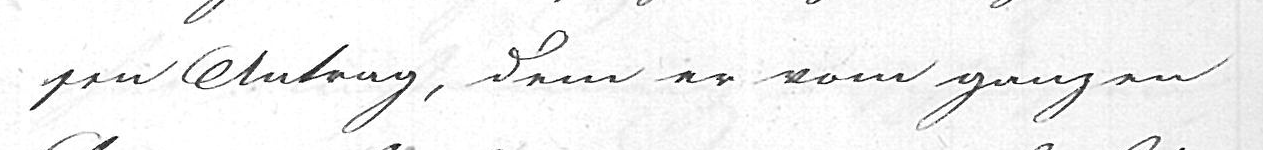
sen Antrag, dem er vom ganzen
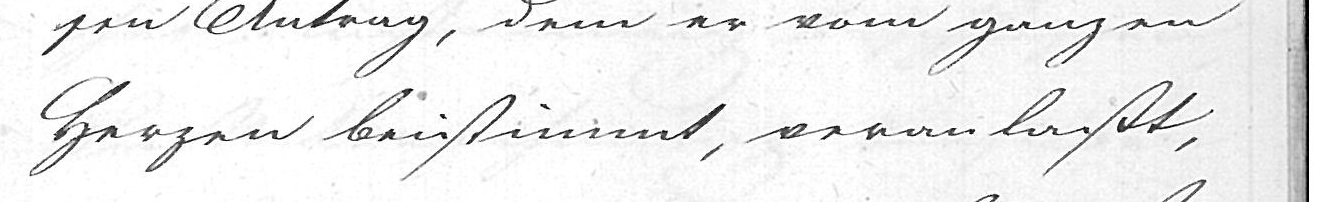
Herzen beistimmt, veranlaßt,
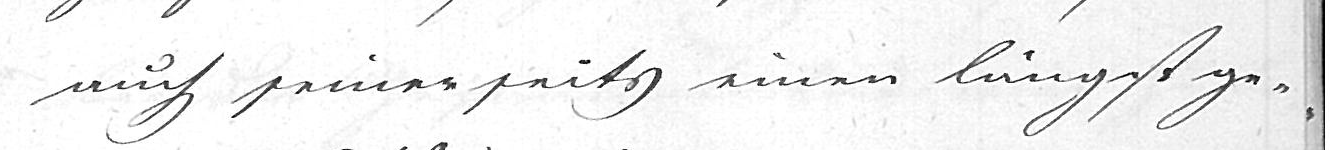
auch seinerseits einen längst ge-
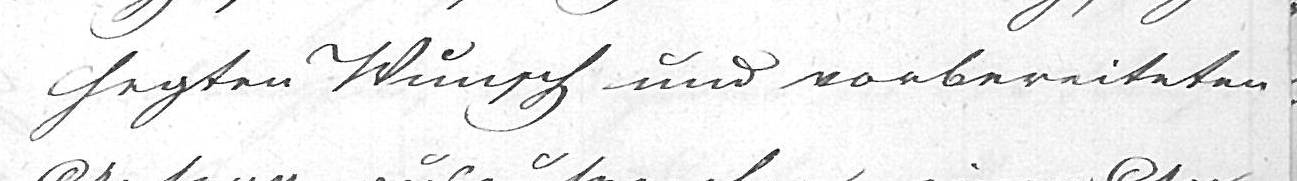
hegten Wunsch und vorbereiteten
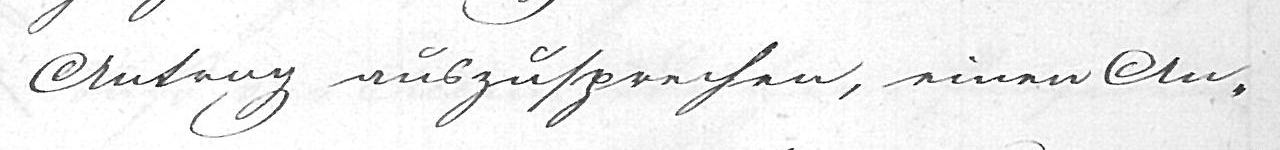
Antrag auszusprechen, einen An-
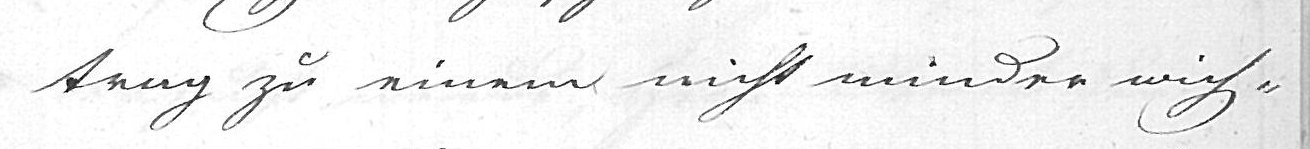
trag zu einem nicht minder wich-
